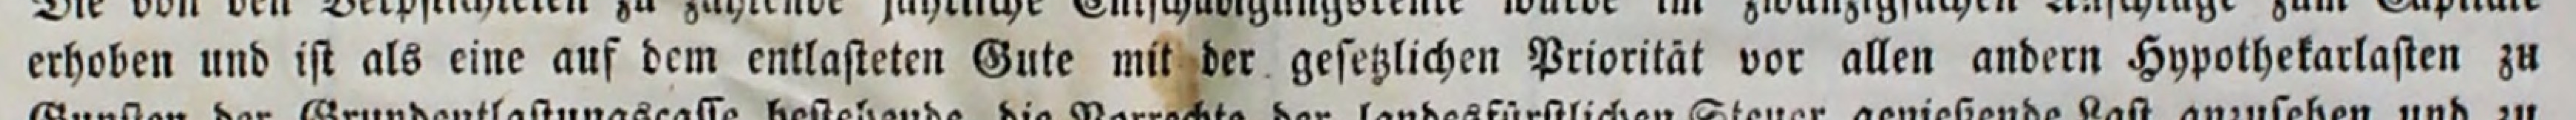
erhoben und ist als eine auf dem entlasteten Gute mit der gesetzlichen Priorität vor allen andern Hypothekarlasten zu
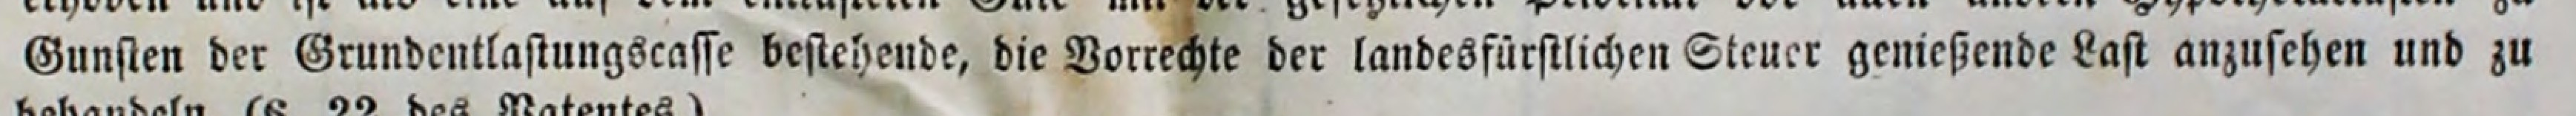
Gunsten der Grundentlastungscasse bestehende, die Vorrechte der landesfürstlichen Steuer genießende Last anzusehen und zu
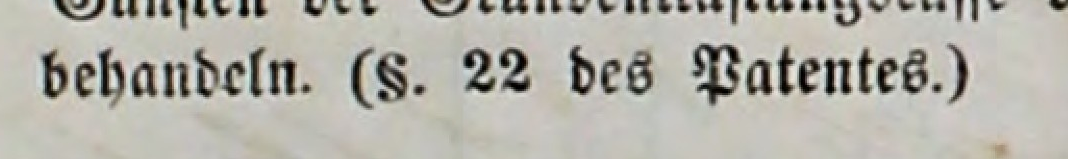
behandeln. (§. 22 des Patentes.)
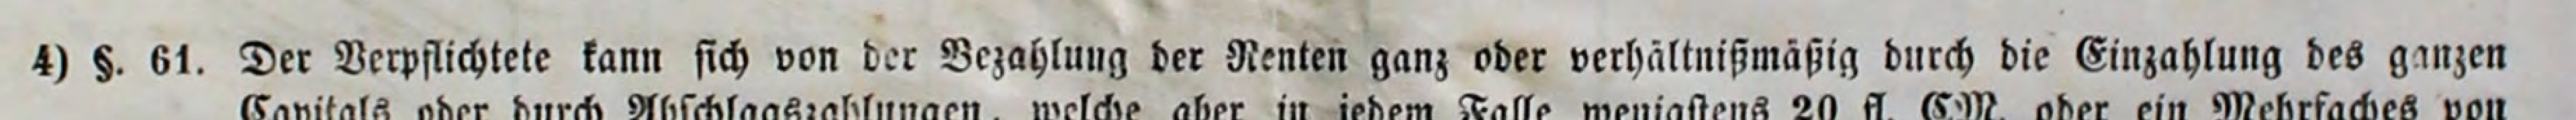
4) §. 61. Der Verpflichtete kann sich von der Bezahlung der Renten ganz oder verhältnißmäßig durch die Einzahlung des ganzen
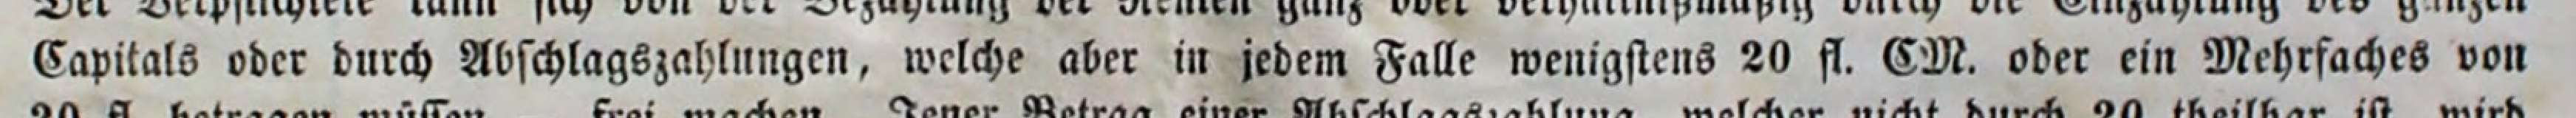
Capitals oder durch Abschlagszahlungen, welche aber in jedem Falle wenigstens 20 fl. CM. oder ein Mehrfaches von
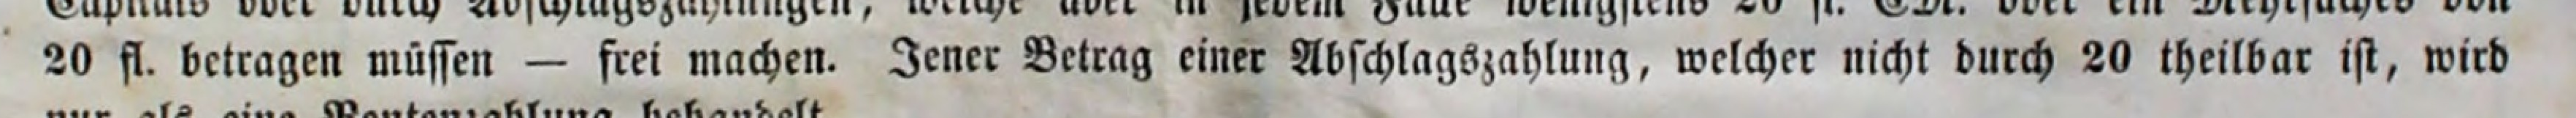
20 fl. betragen müssen — frei machen. Jener Betrag einer Abschlagszahlung, welcher nicht 20 theilbar ist, wird
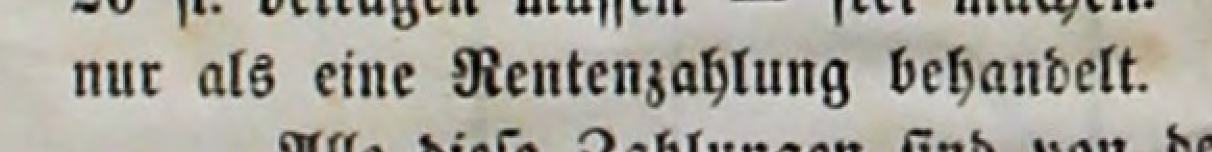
nur als eine Rentenzahlung behandelt.
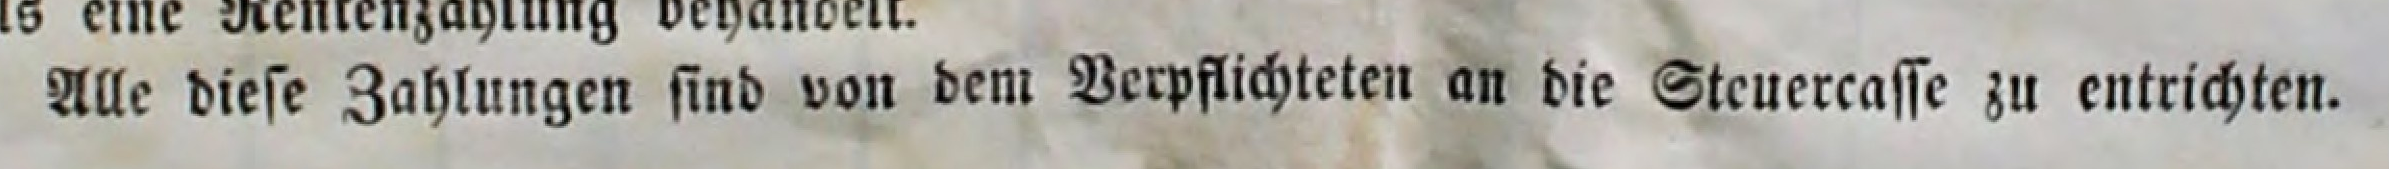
Alle diese Zahlungen sind von dem Verpflichteten an die Steuercasse zu entrichten.
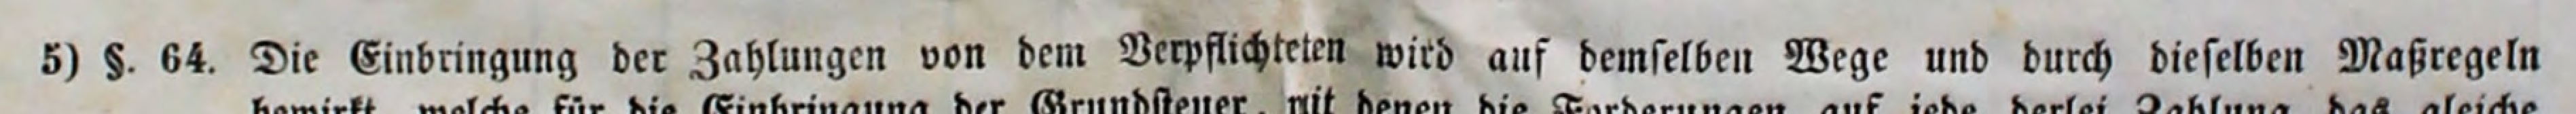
5) §. 64. Die Einbringung der Zahlungen von dem Verpflichteten wird auf demselben Wege und durch dieselben Maßregeln
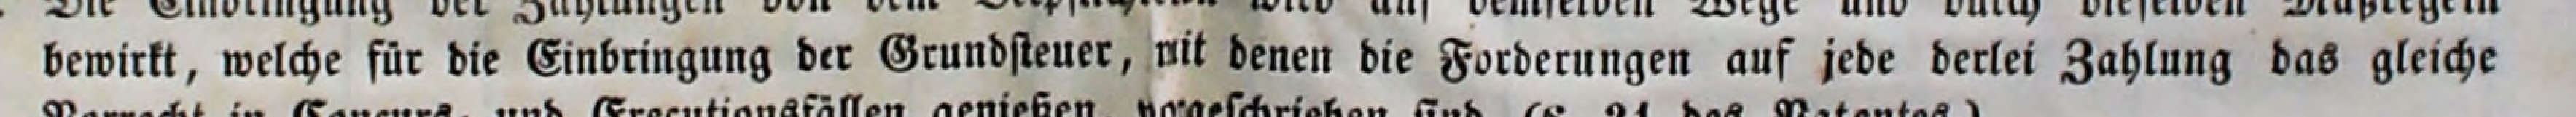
bewrikt, welche für die Einbringung der Grundsteuer, mit denen die Forderungen auf jede derlei Zahlung das gleiche
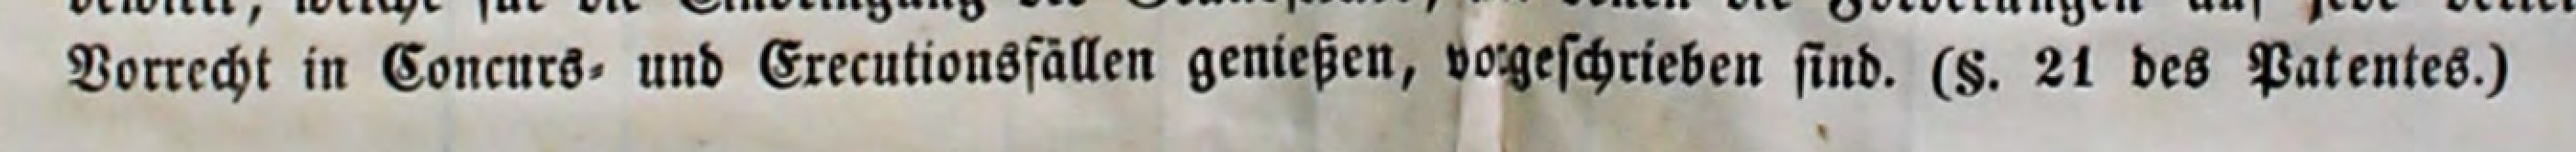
Vorrecht in Concurs= und Executionsfällen genießen, vorgeschrieben sind. (§. 21 des Patentes.)
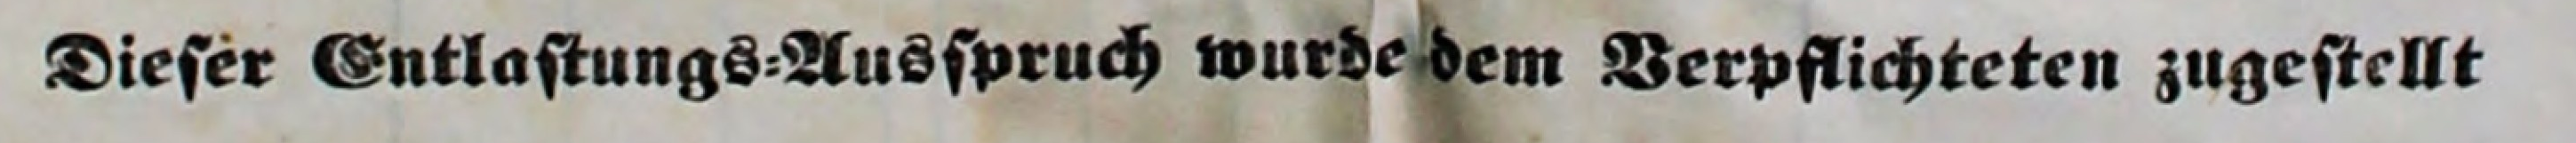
Dieser Entlastungs=Ausspruch wurde dem Verpflichteten zugestellt
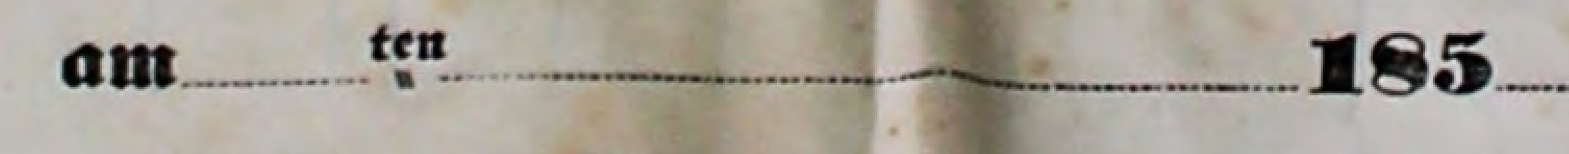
am ....... ten ..........185 ..........
